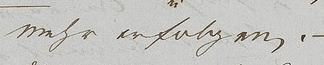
mehr erfolgen. –
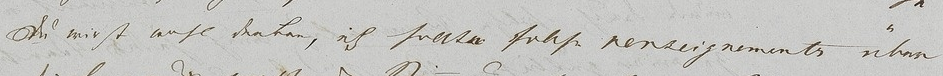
Du wirst wohl denken, ich sollte solche renseignements über
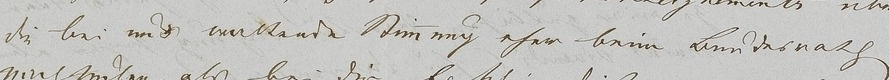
die bei uns waltende Stimmung eher beim Bundesrath
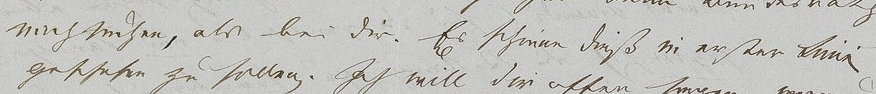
nachsuchen, als bei dir. Es scheine dieß in erster Linie
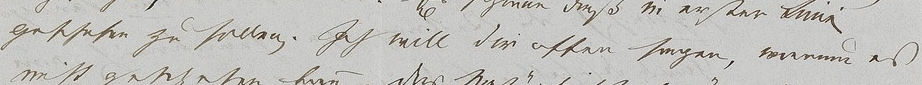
geschehen zu sollen. Ich will dir offen sagen, warum es
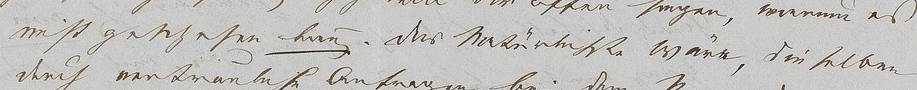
nicht geschehen kann. Das Natürlichste wäre, dieselben
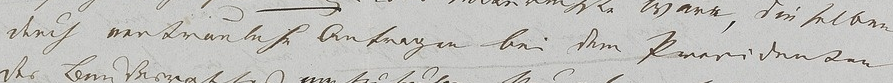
durch vertrauliche Anfragen bei dem Presidenten
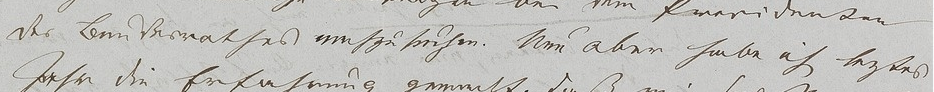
des Bundesrathes nachzusuchen. Nun aber habe ich leztes
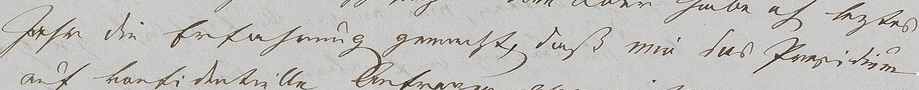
Jahr die Erfahrung gemacht, daß mir das Presidium
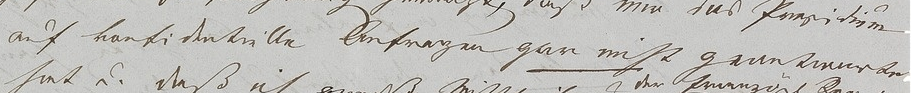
auf konfidentielle Anfragen gar nicht geantwortet
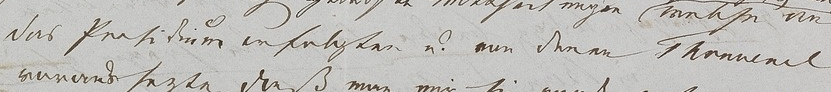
das Presidium erfolgten u. von denen Thouvenel
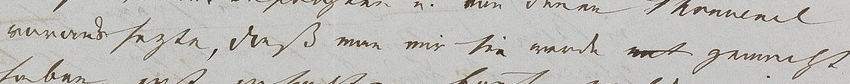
voraussezte, daß man mir sie werde mit gemacht
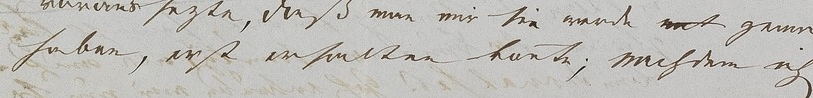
haben, erst erhalten konnte; nachdem ich
